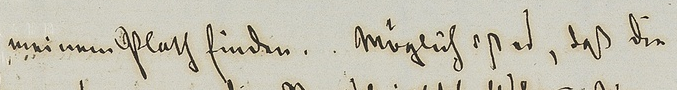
meinem Platz finden. Möglich ist es, daß die
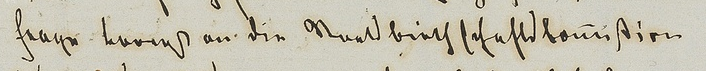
Frage vorerst an die Staatswirthschaftskommißion
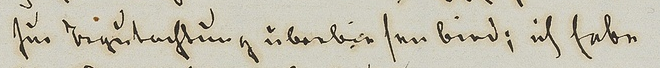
zur Begutachtung überwiesen wird; ich habe
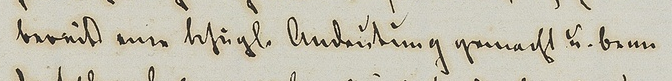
bereits eine bezügl. Andeutung gemacht u. wenn
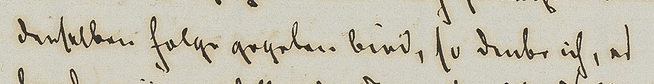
derselben Folge gegeben wird, so denke ich, es
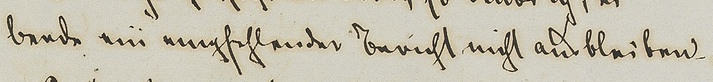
werde ein empfehlender Bericht nicht ausbleiben.
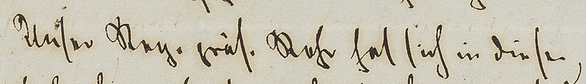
Unser Reg.präs. Rohr hat sich in dieser
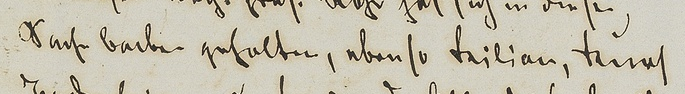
Sache wacker gehalten, ebenso Kilian, Kurz
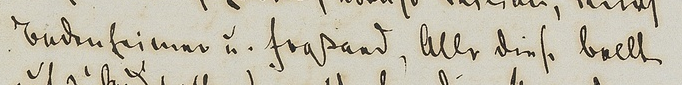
Bodenheimer u. Froßard. Alle diese wollten
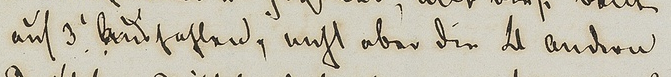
auf 3t auszahlen, nicht aber die 4 andern
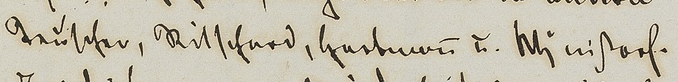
Teuscher, Ritschard, Hartmann u. Wynistorf.
